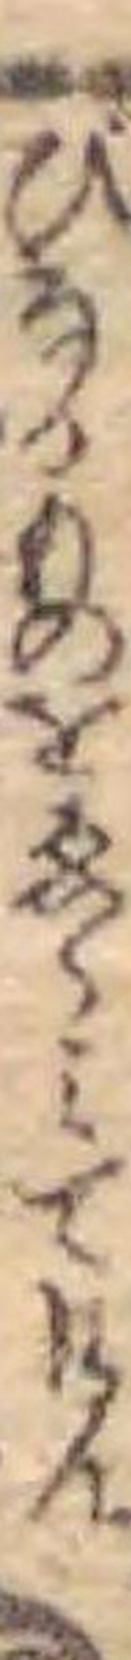びなるものをゑらみてけん上し
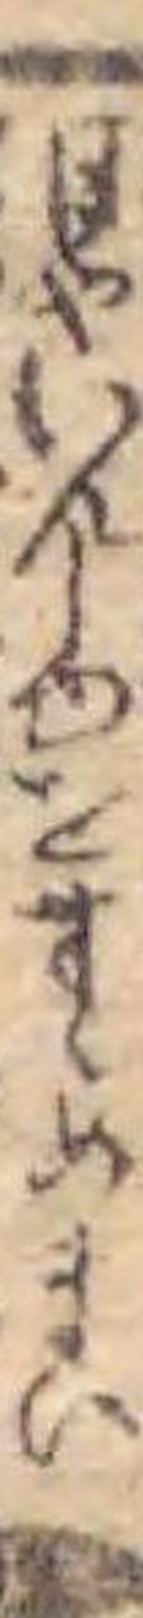日やいんしゆをすゝめまいらせ
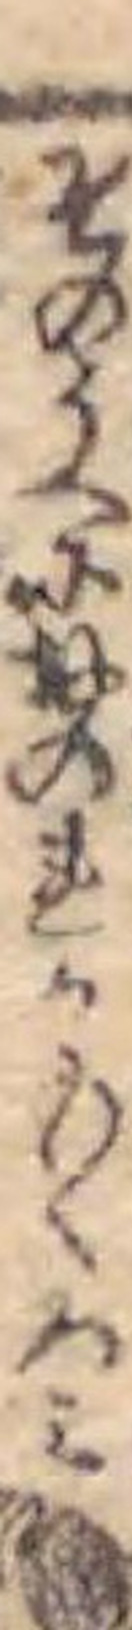そのうへにおのれかもくろみ
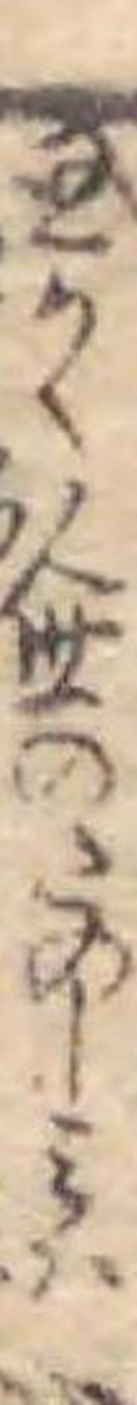〽とかく人世のたのしみは
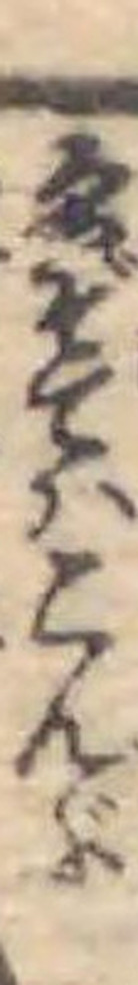ゑそてはこんぶ
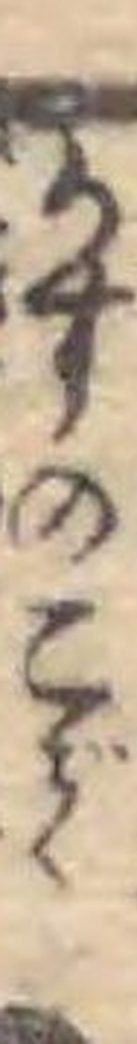かすのこで
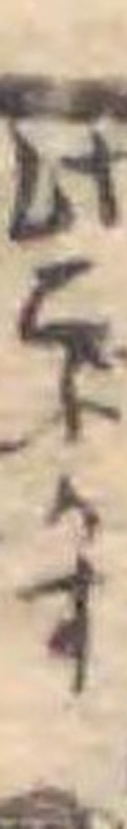此こぶかす
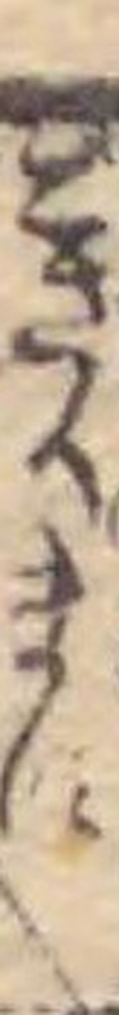ごさります
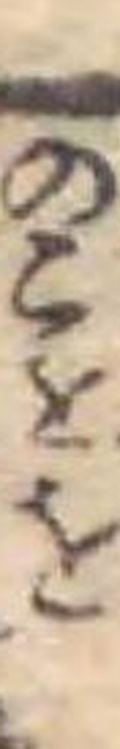のこをを
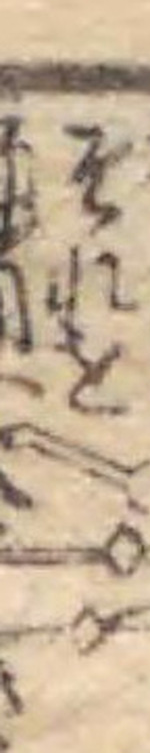それを
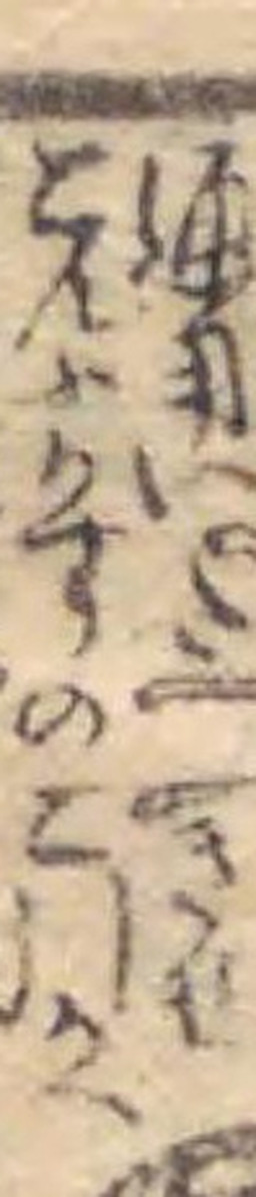こんふかすのこ引かへ
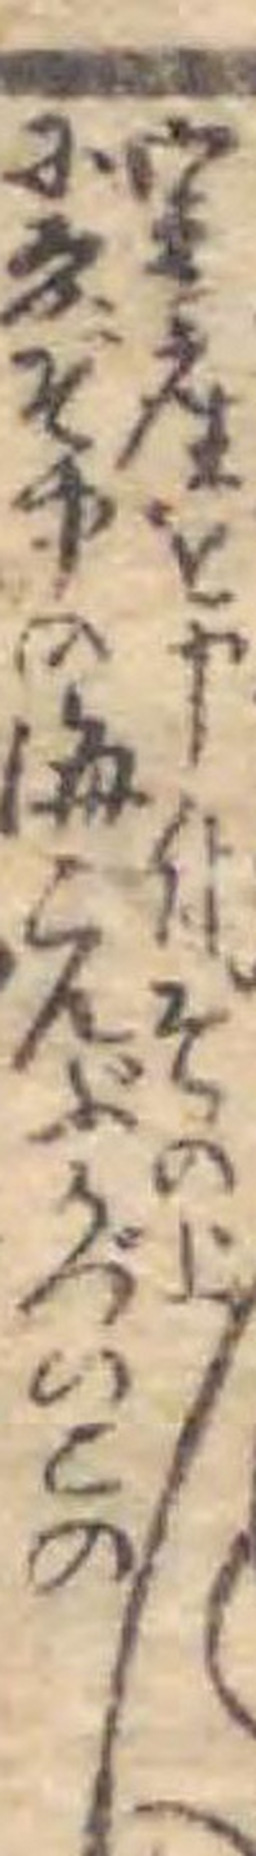にゑそ中の海こんぶかづのこの
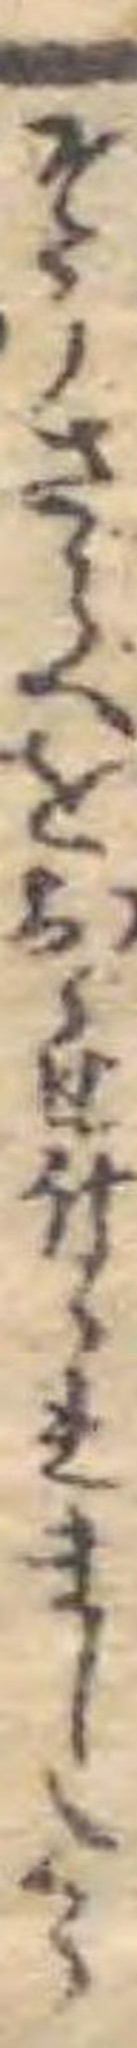そうさらへをおゝせ付られましたら
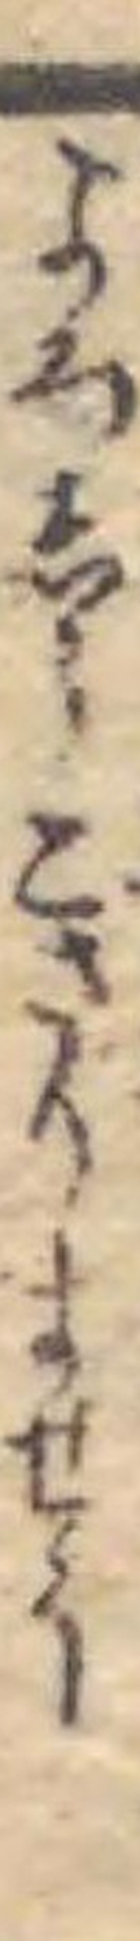よろしうこさりませう
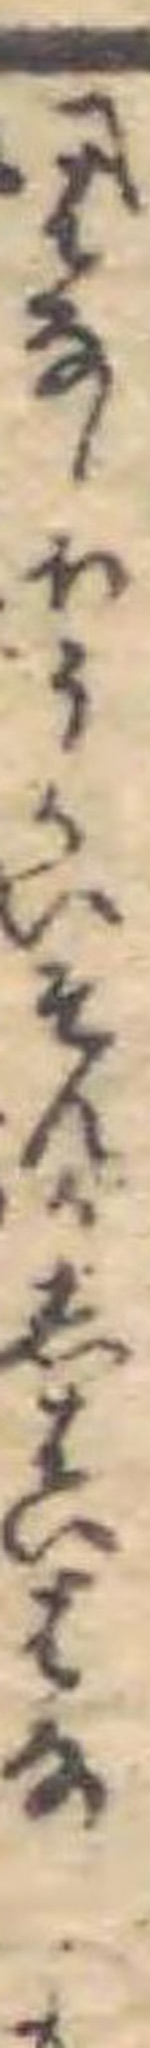〽はなしほうかいそんがしはいはなも
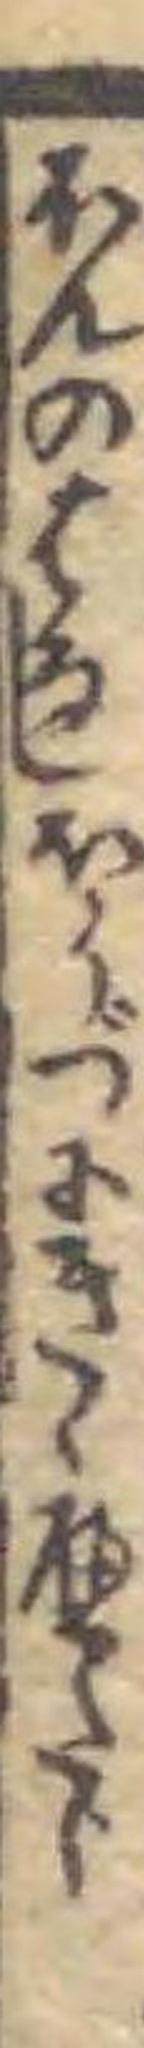ほんのはなしほうづにきゝへたゞ
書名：悦贔負蝦夷押領 : 3巻
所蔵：国立国会図書館 National Diet Library, JAPAN
